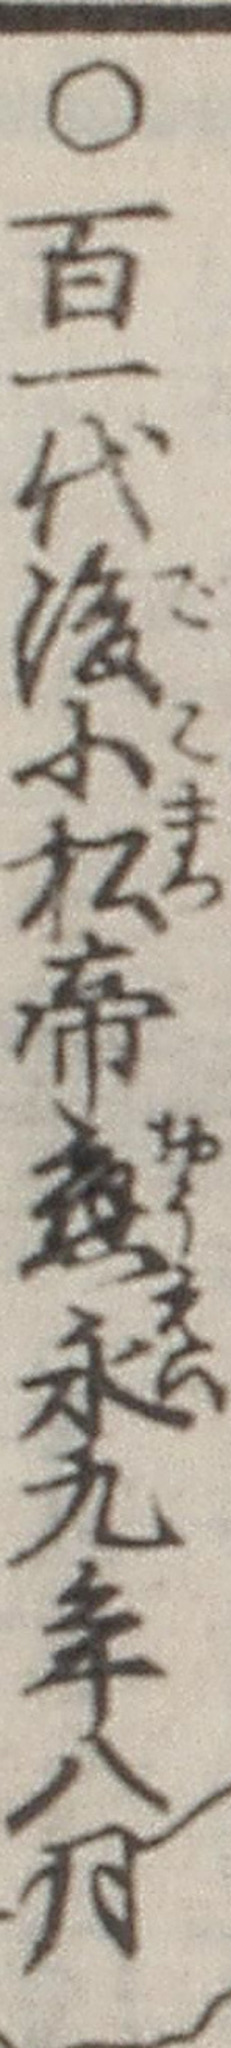○百一代後小松帝応永九年八月
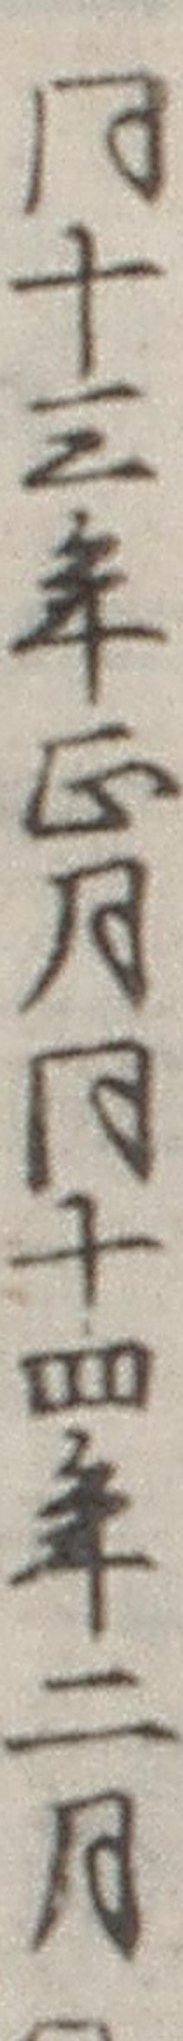同十三年正月同十四年二月
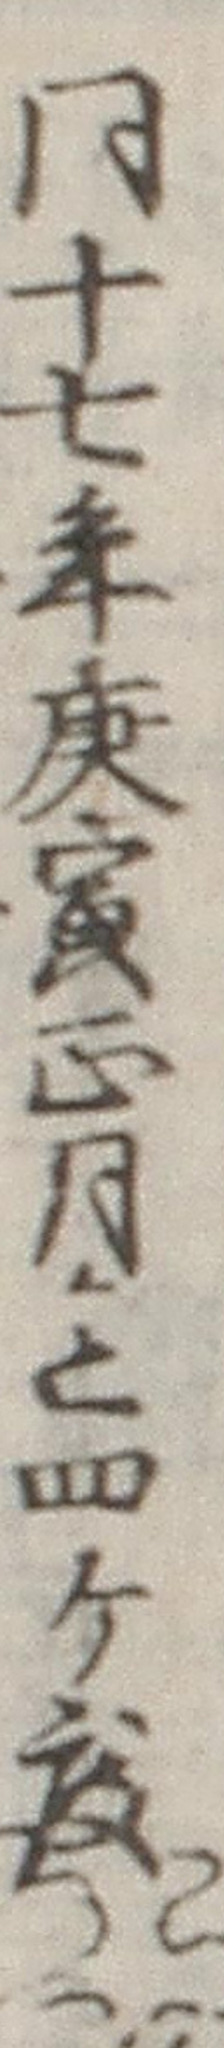同十七年庚寅正月迄四ヶ度
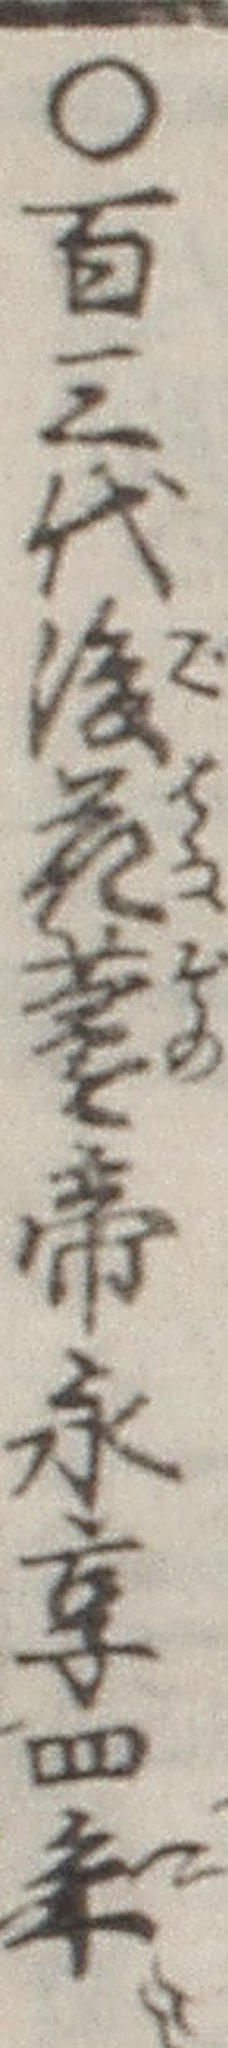○百三代後花園帝永享四年
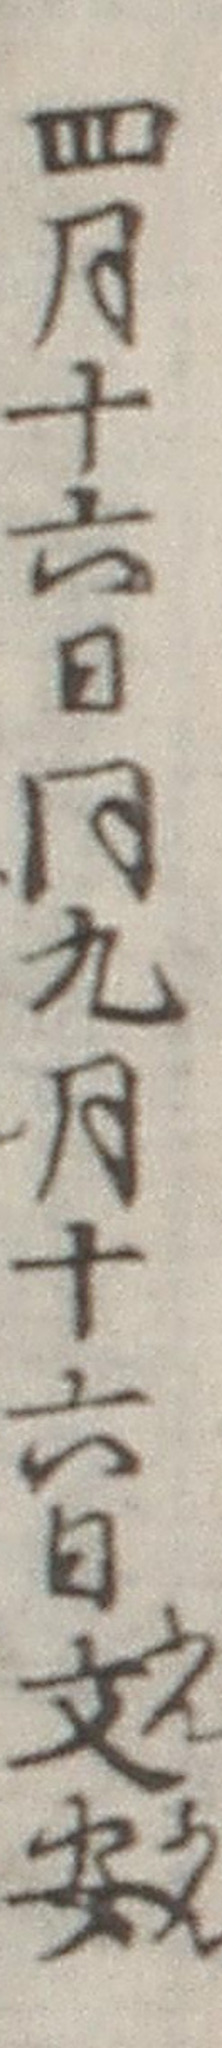四月十六日同九月十六日文安
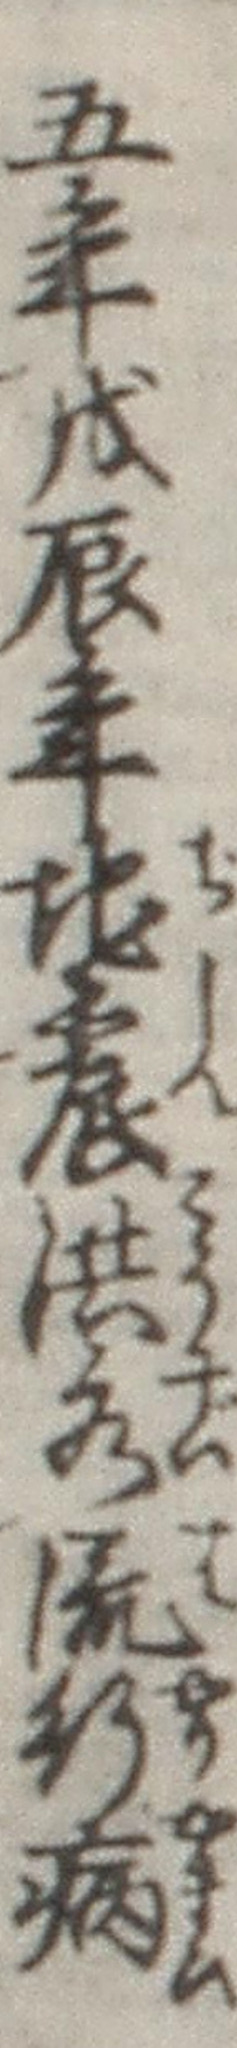五年戊辰年地震洪水流行病
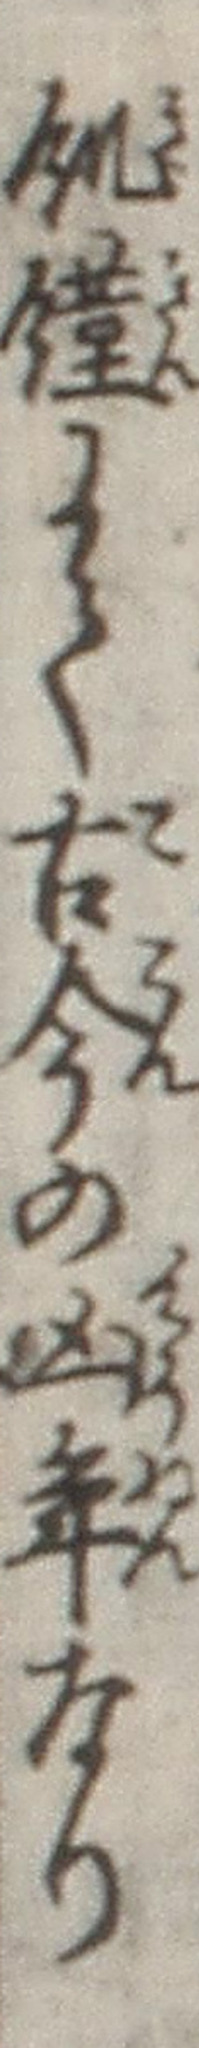饑饉にて古今の凶年なり

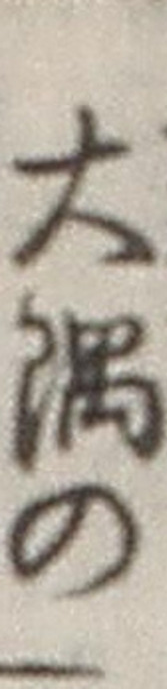大隅の
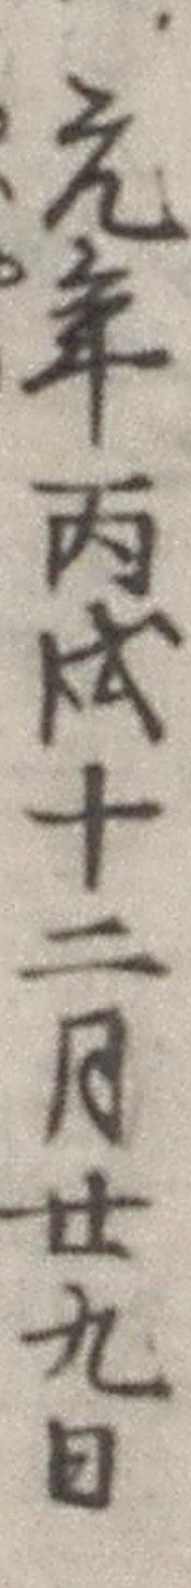元年丙戌十二月廿九日
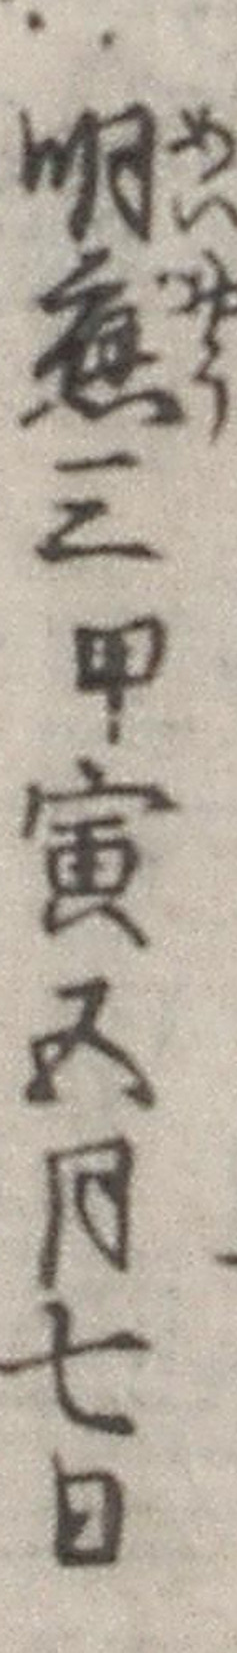明応三甲寅五月七日
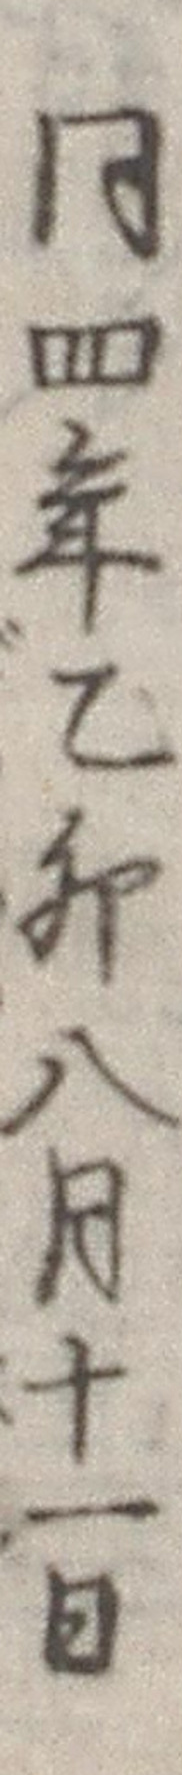同四年乙卯八月十一日
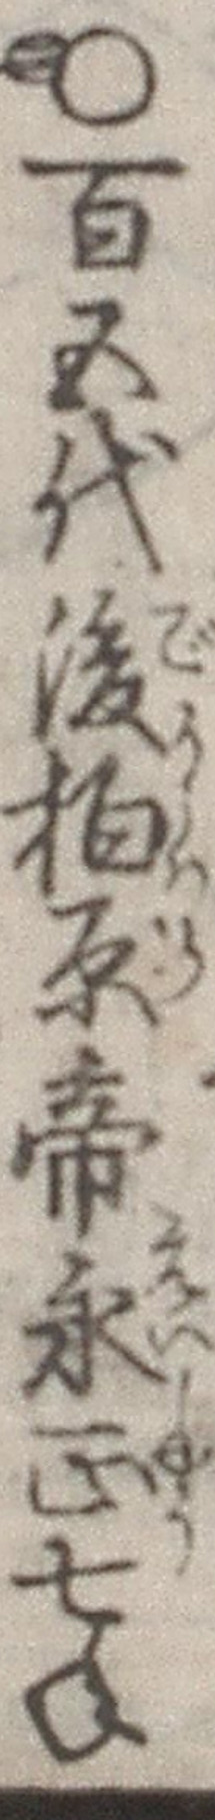○百五代後柏原帝永正七年
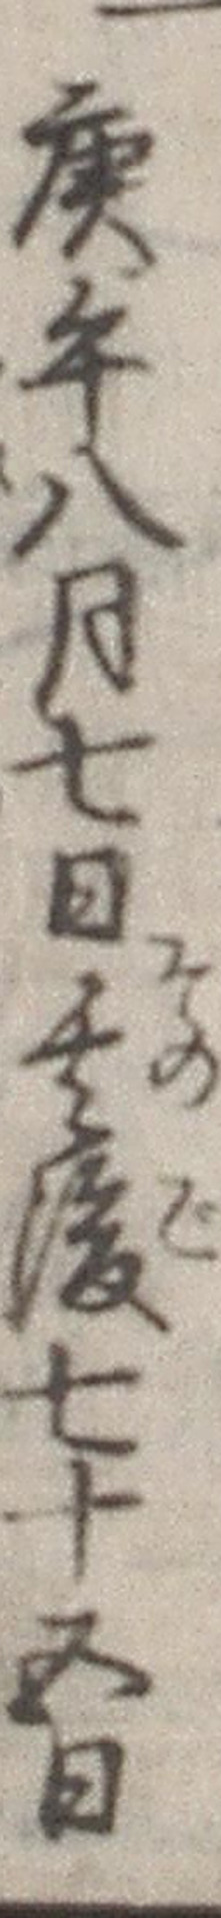庚午八月七日其後七十五日
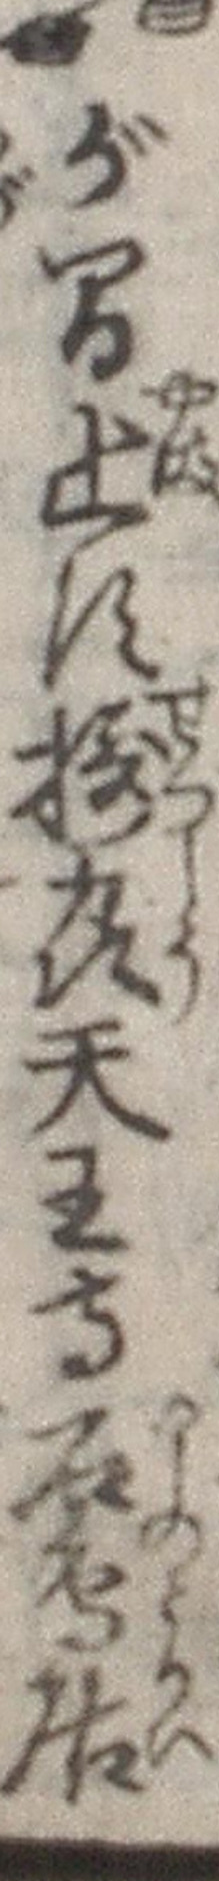が間止す摂州天王寺石鳥居
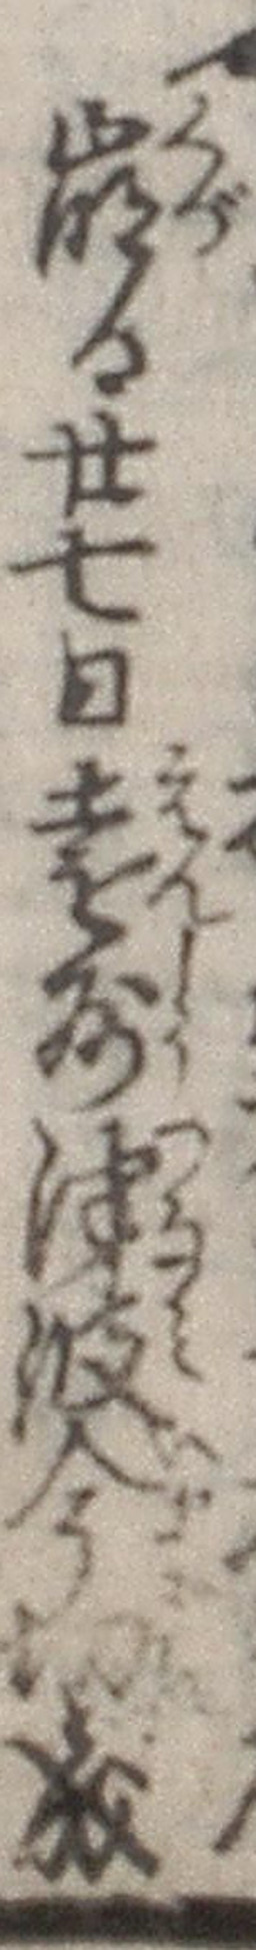崩る廿七日遠州津波今切と成
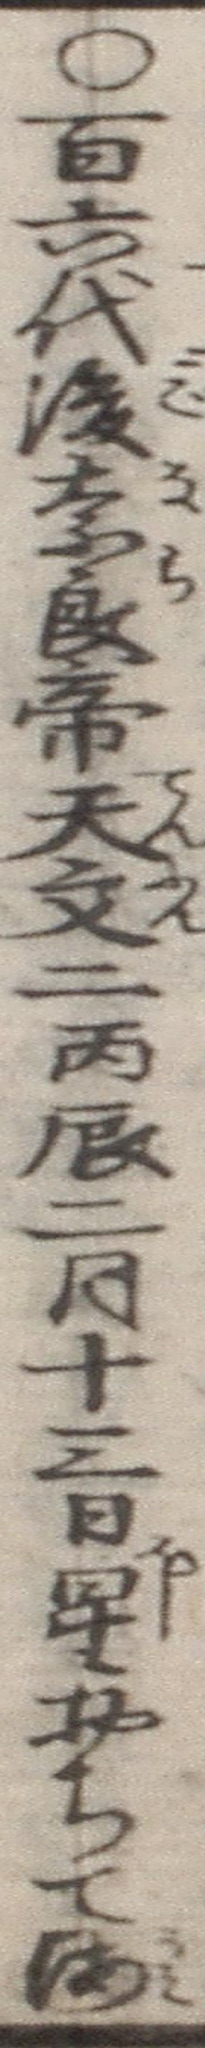○百六代後奈良帝天文二丙辰二月十三日星おちて海
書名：諸國大地震年代記　末代噺種
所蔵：東京大学地震研究所図書室 Earthquake Research Institute Library, The University of Tokyo, JAPAN
